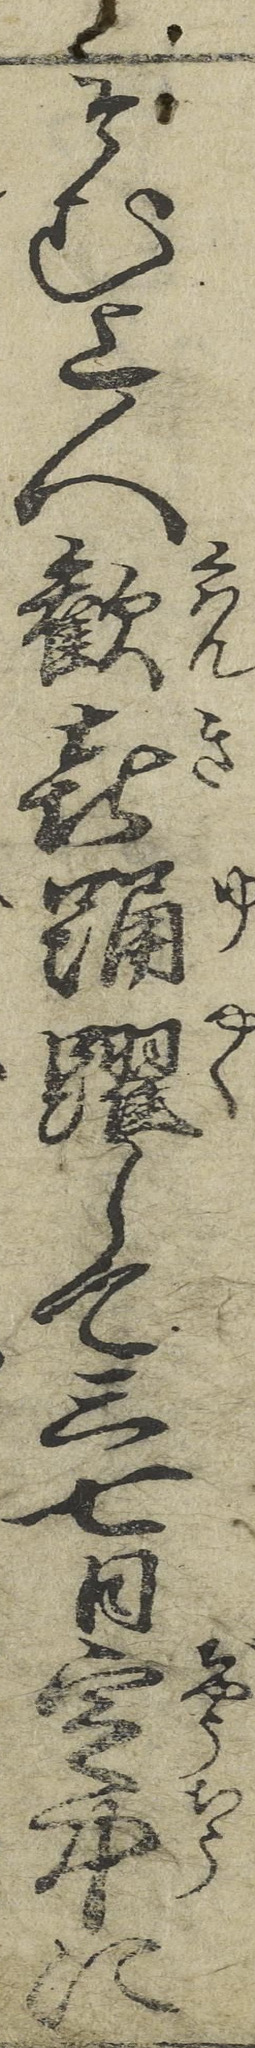そむ上人歓喜踊躍して三七日定中に
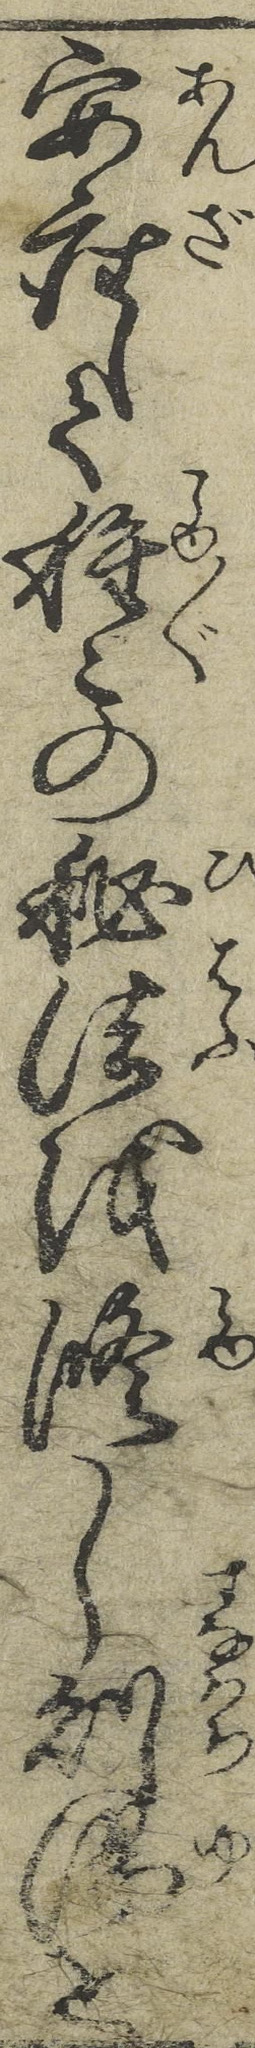安座して種〻の秘法を修し則湯を
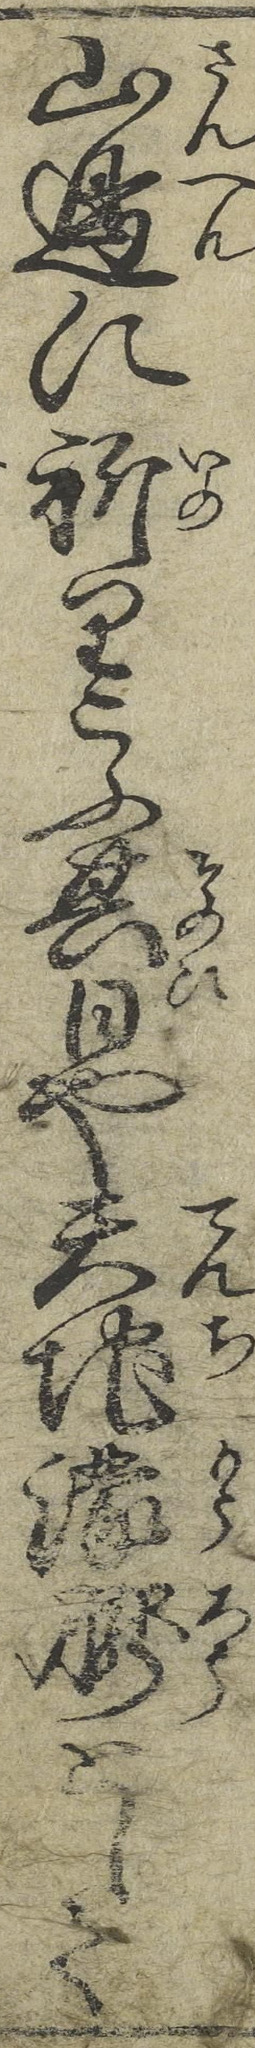山辺に祈りこふ其日や天地朦朧として
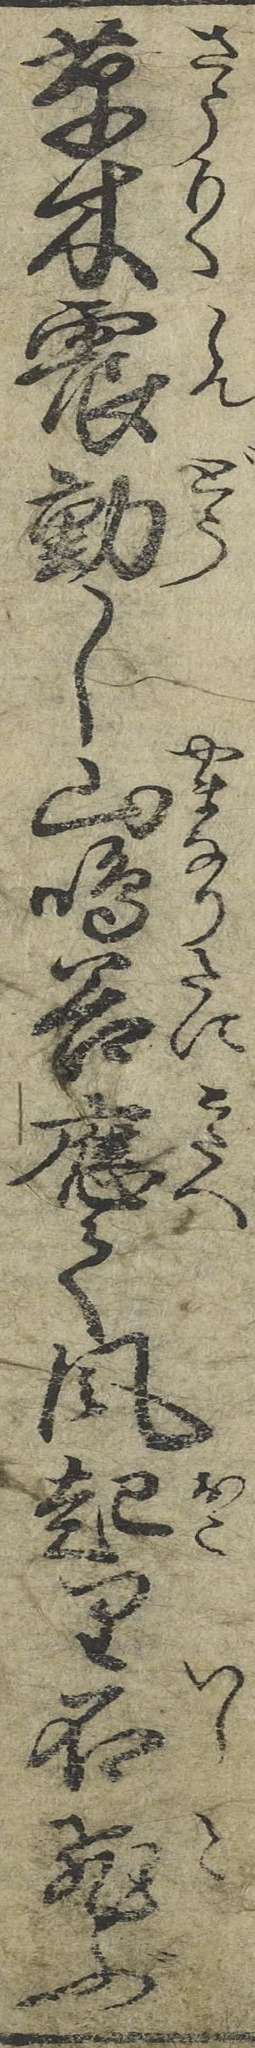草木震動し山鳴谷応て起り石飛ぶ

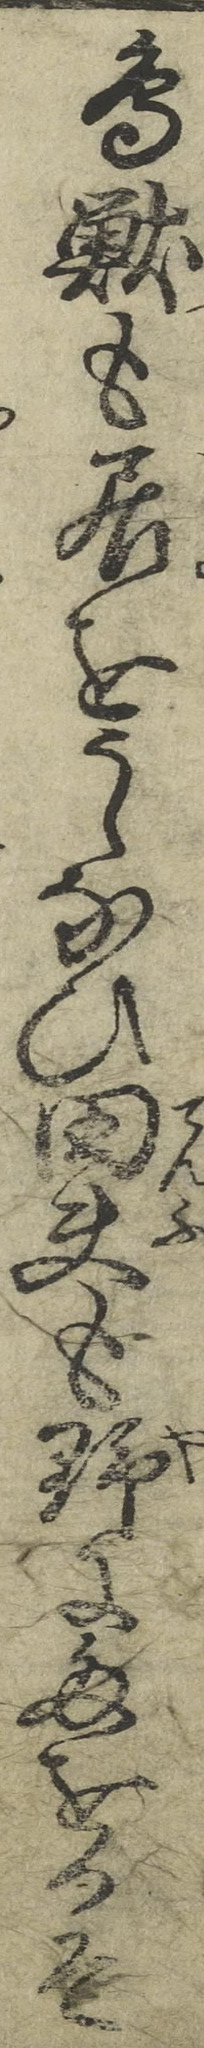鳥獣も居をうしなひ田夫も野にたおるそ
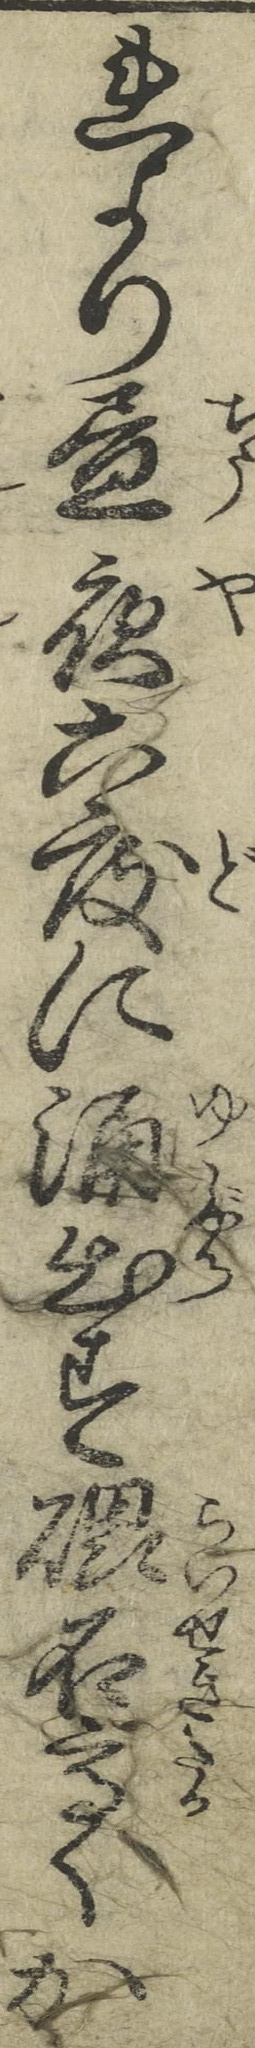れより昼夜六度に涌出す礧石高くか
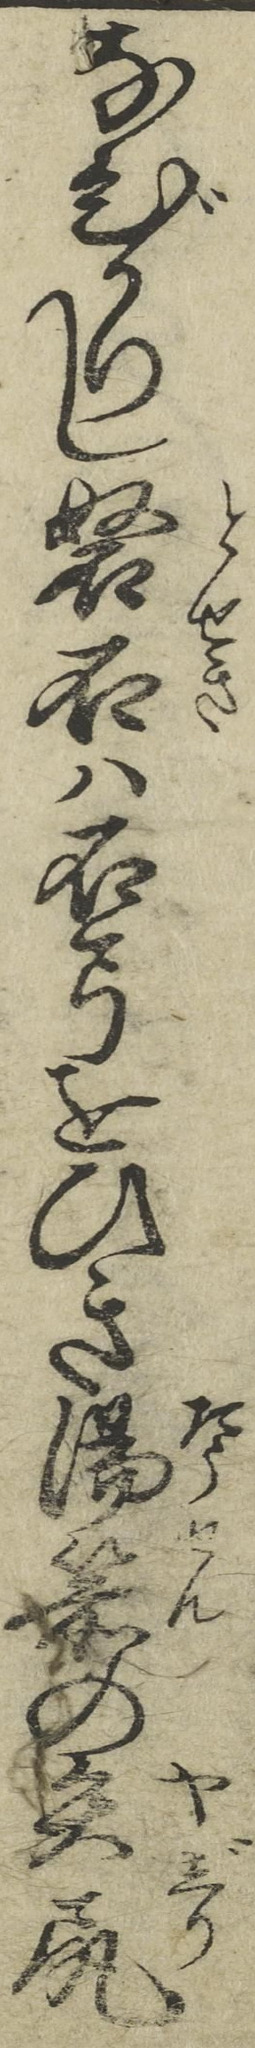なびかりし砮石は石弓をひき湯箭の矢尻
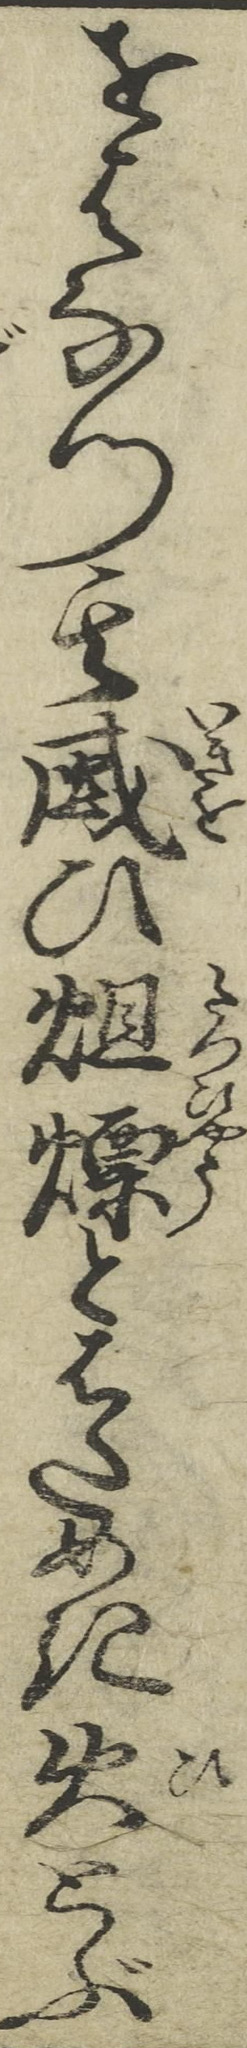をはなつ其威ひ炟熛とはためき火とぶ
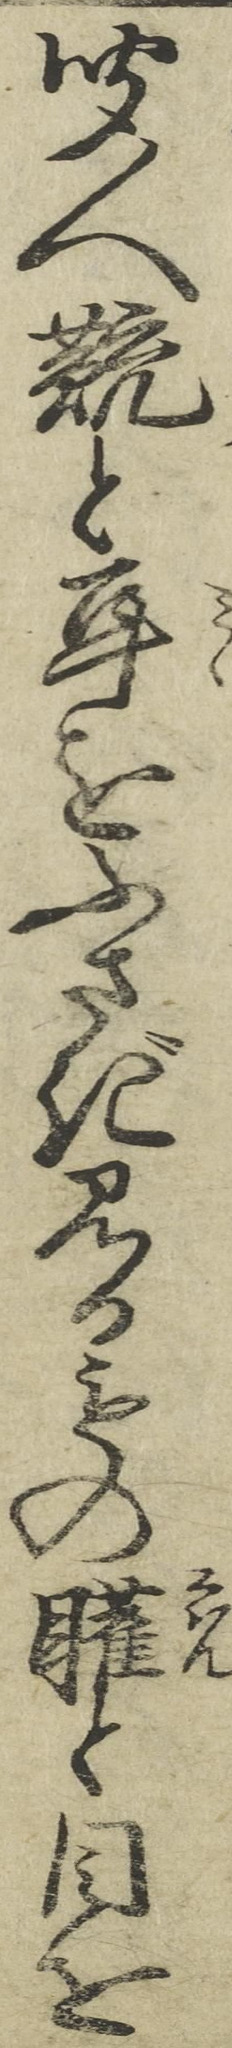聞へじうと耳をふさぎ見るもの矔と目を
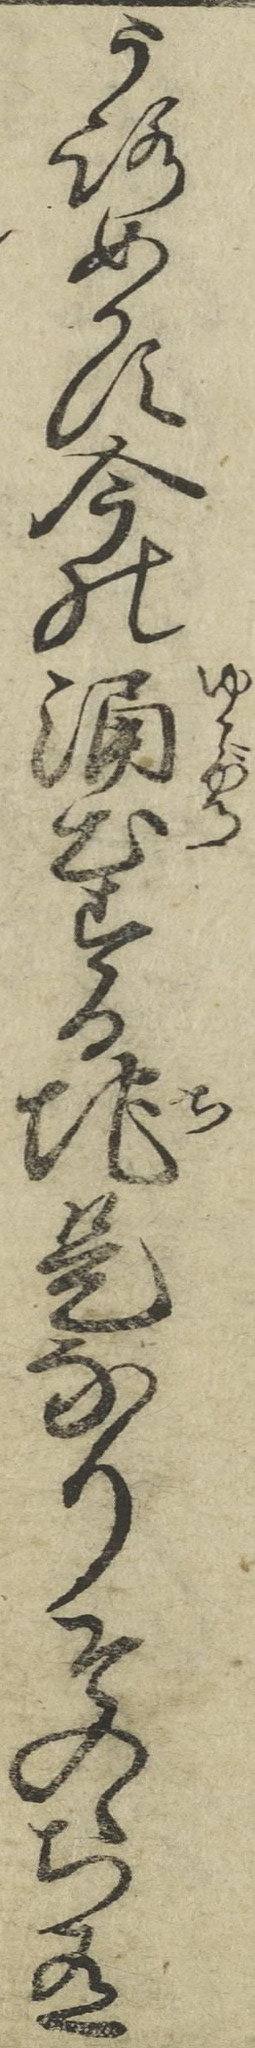うろめかす今の涌出する地是なりそのゝち有
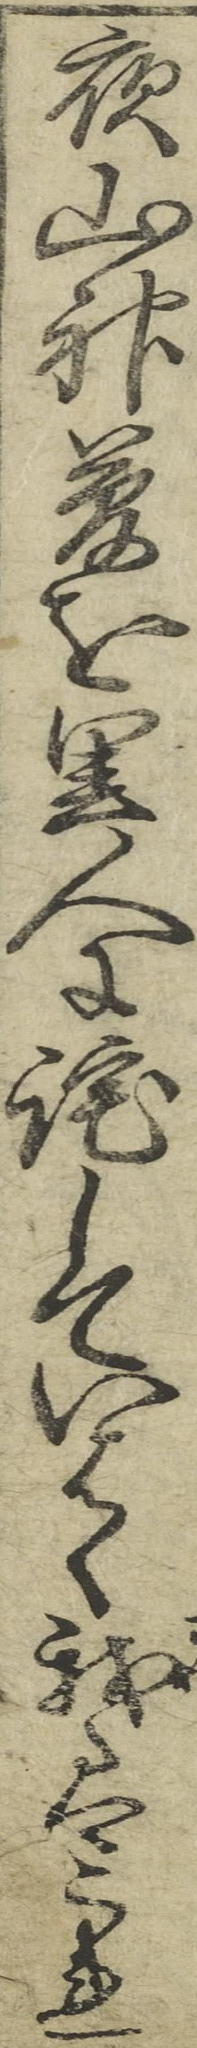夜山神夢を里人に詫していはく我はこれ
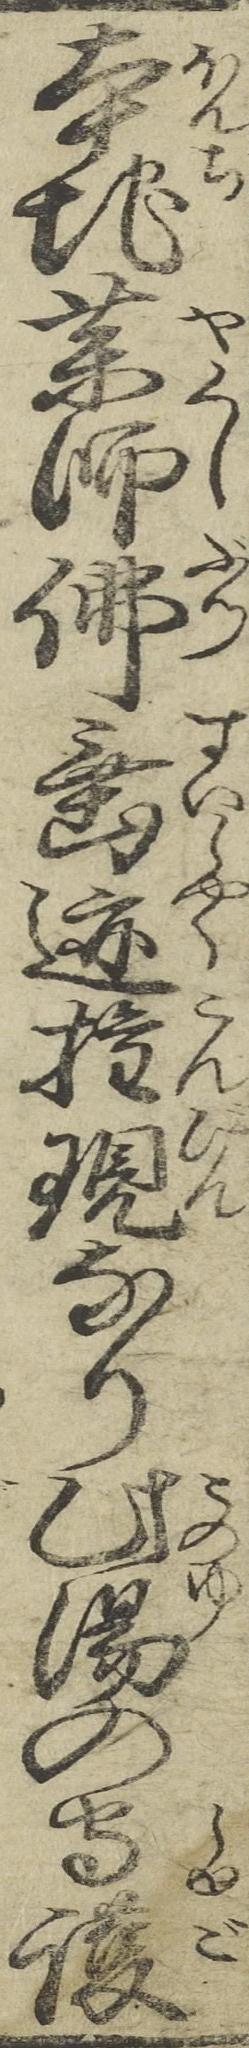本地薬師仏垂迹権現なり此湯守護
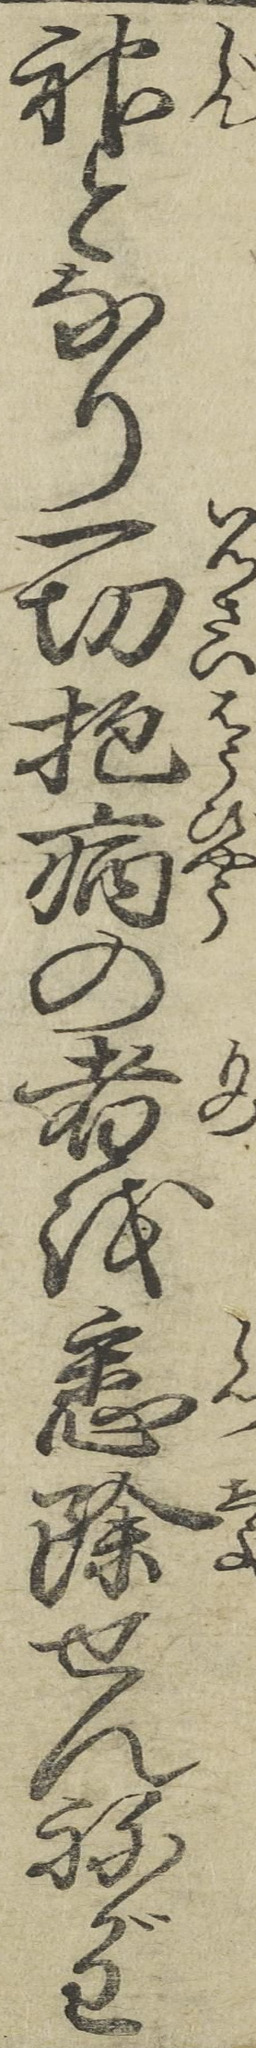神となり一切抱病の者を悉除せんねがわ
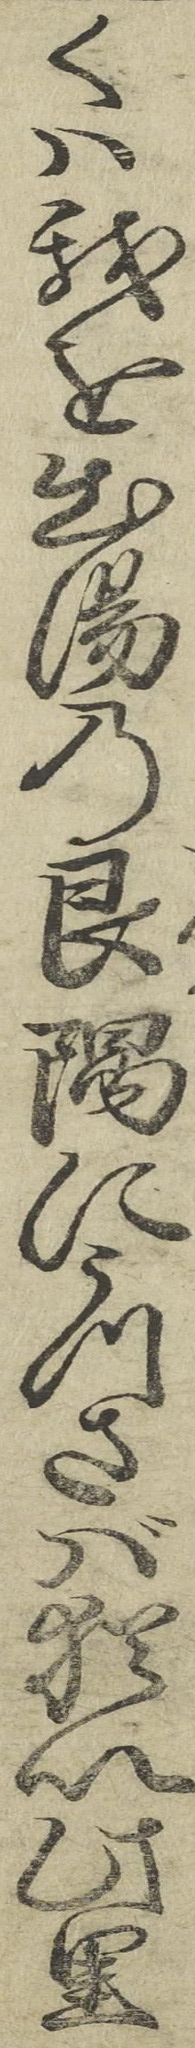くは我を出湯の艮隅にうつさば猶以此里
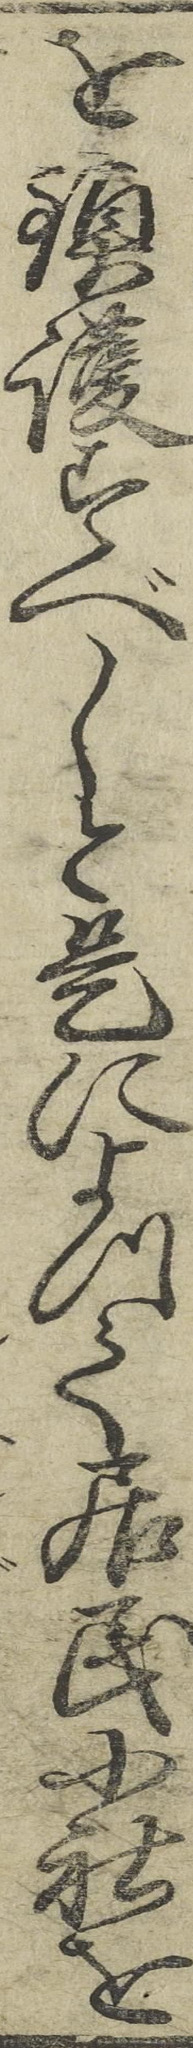を鎮護すべしと是によつて居民小社を
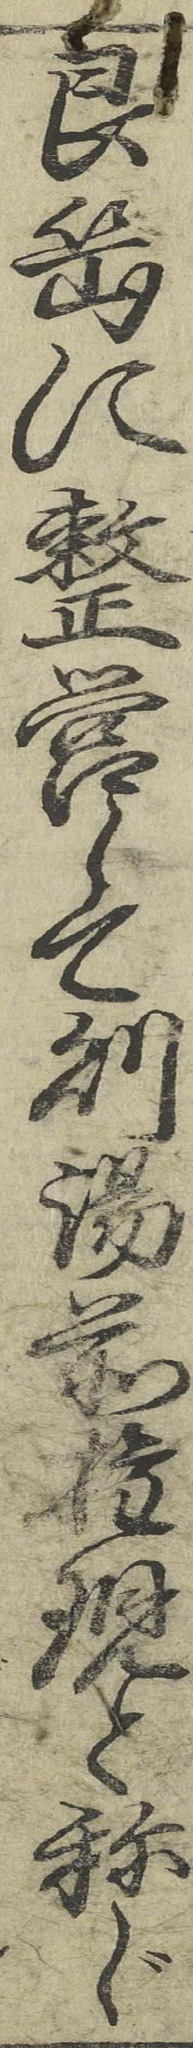艮岳に整営して則湯前権現と称じ
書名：伊豆國熱海温泉縁起
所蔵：東京大学地震研究所図書室 Earthquake Research Institute Library, The University of Tokyo, JAPAN
